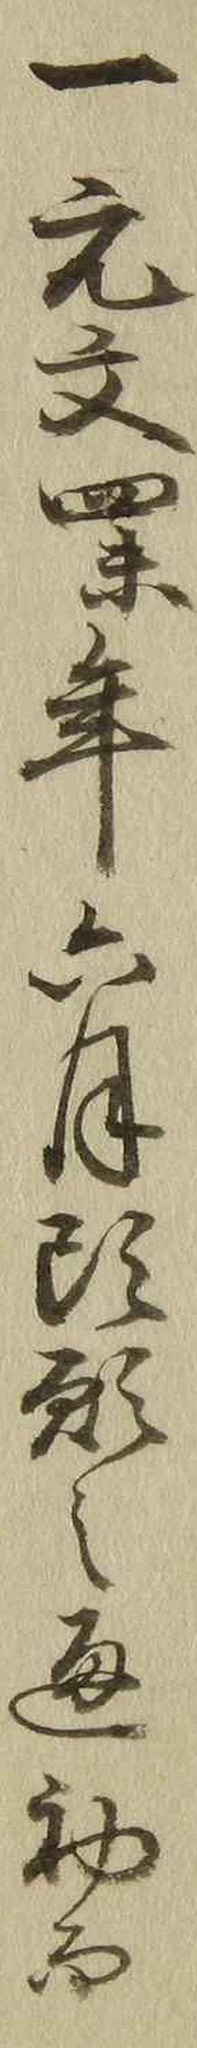一元文四未年六月頭願之通初而
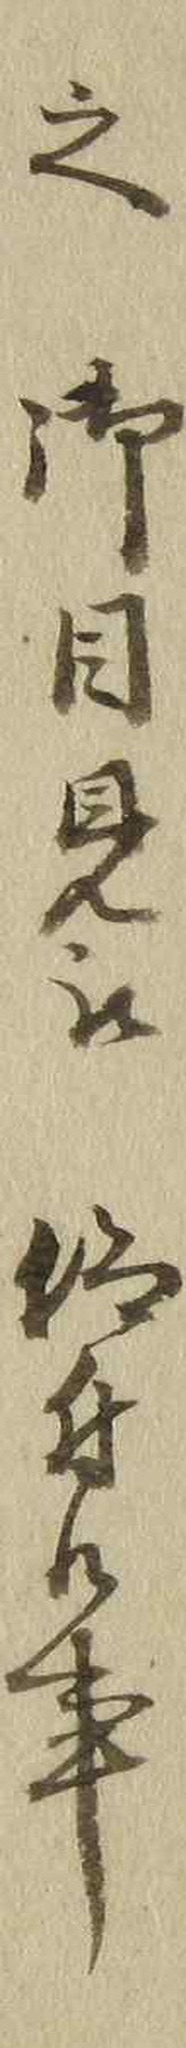之御目見被仰付候事
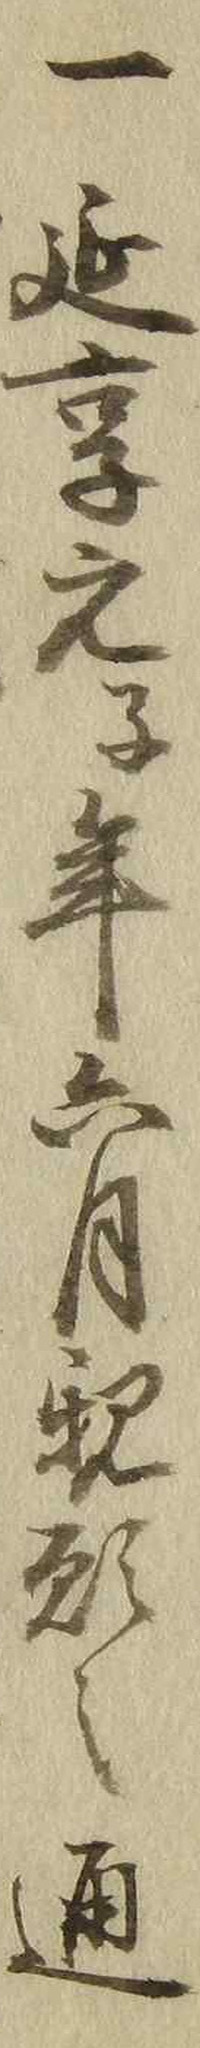一延享元子年六月親願之通
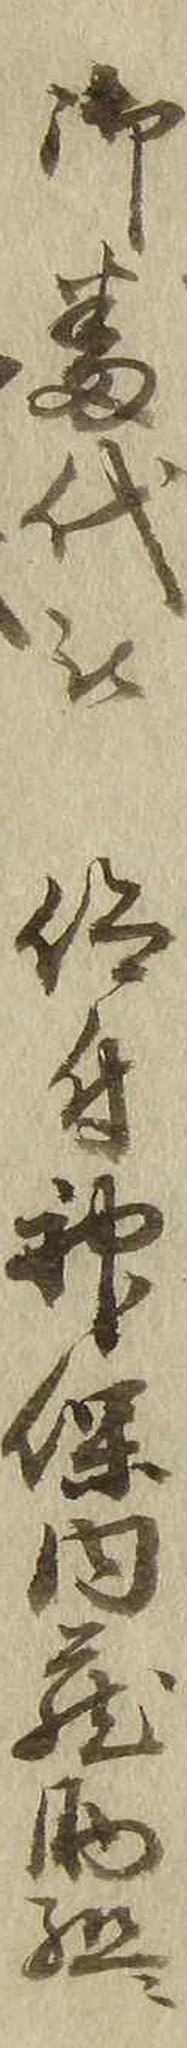御番代被仰付神保内蔵助組ニ
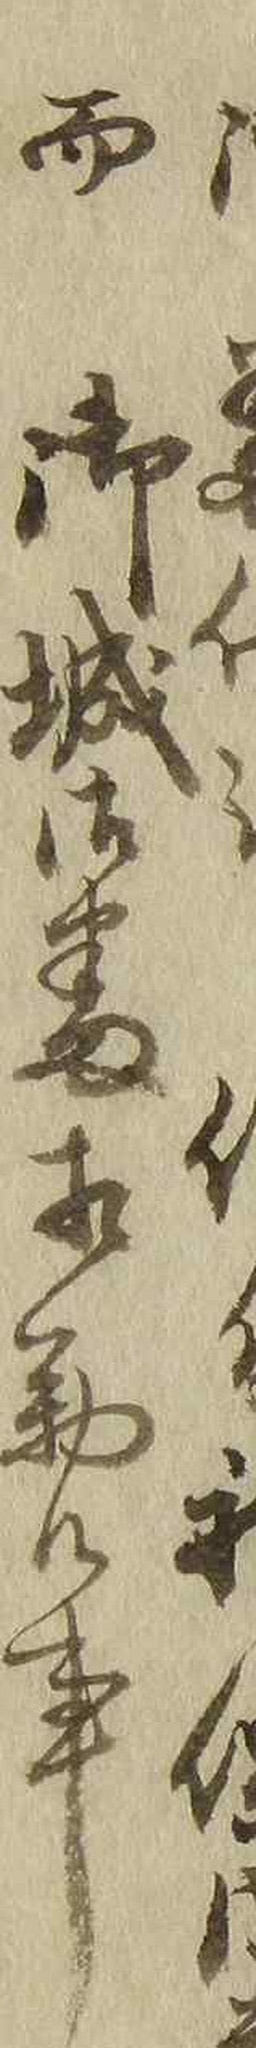而御城御番相勤候事
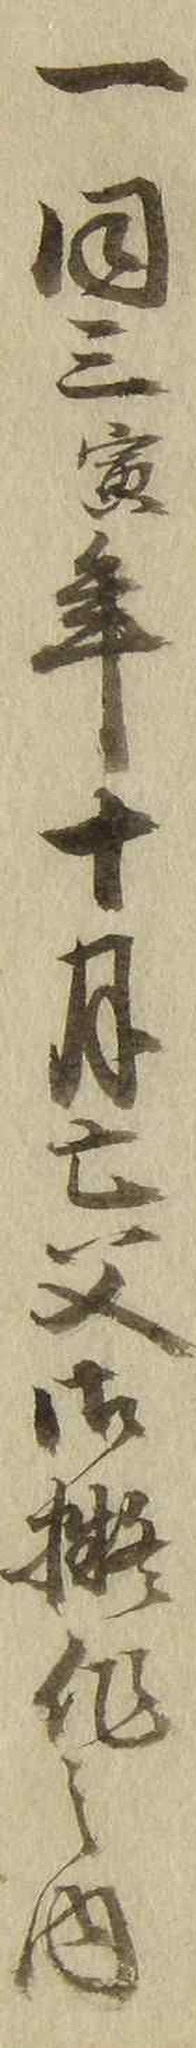一同三寅年十月亡父擬作之内

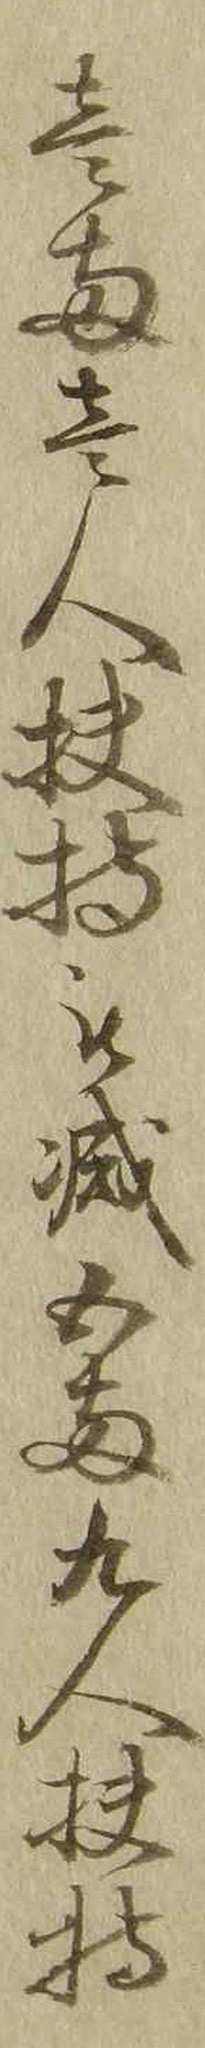壱両壱人扶持被減五両九人扶持
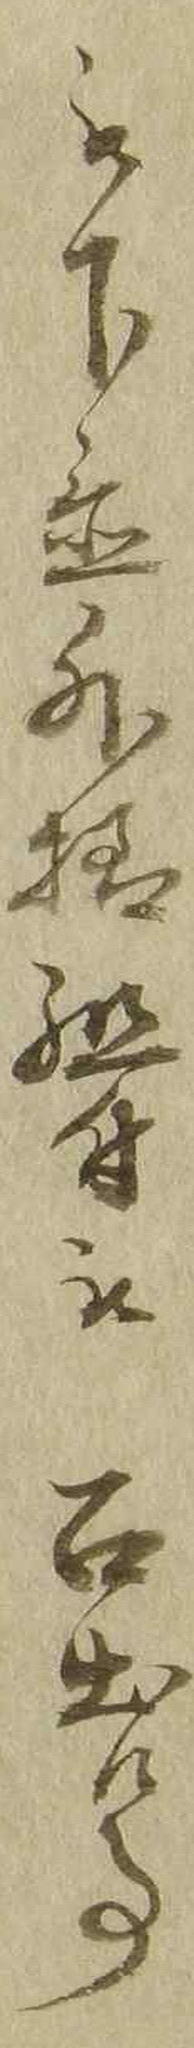被下置外様組候事付被召出候事
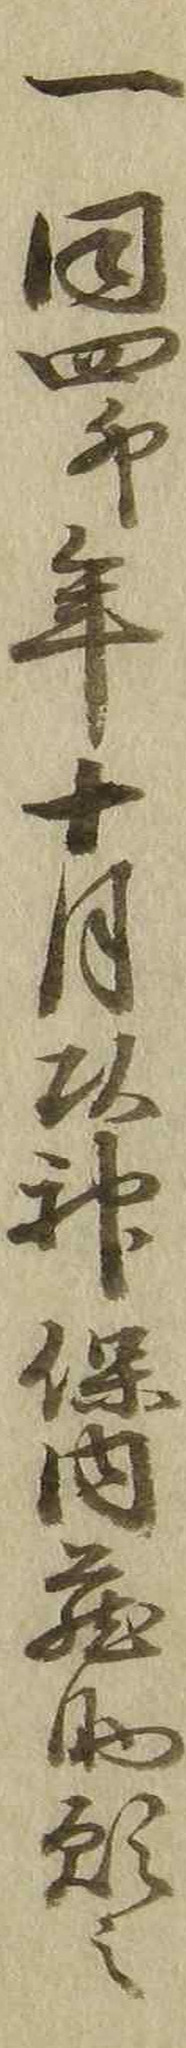一同四卯年十月頭神保内蔵助願之
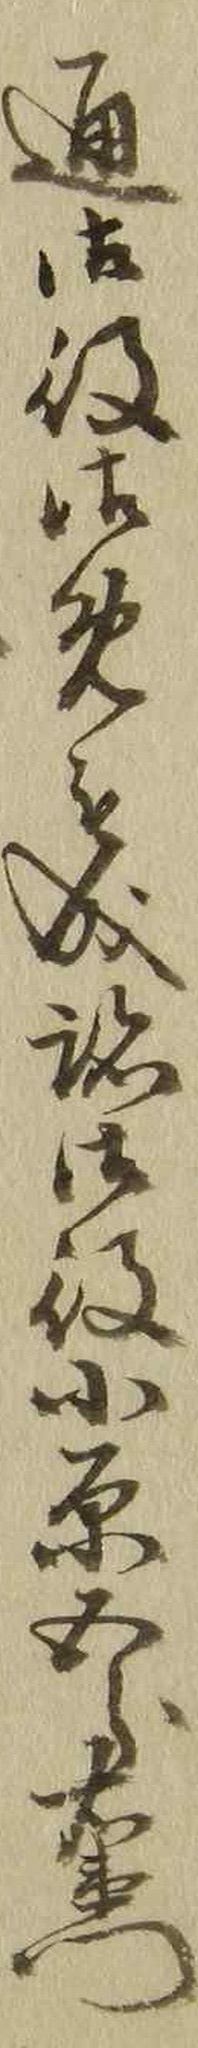通御役御免被成諸御役小原五郎右衛門
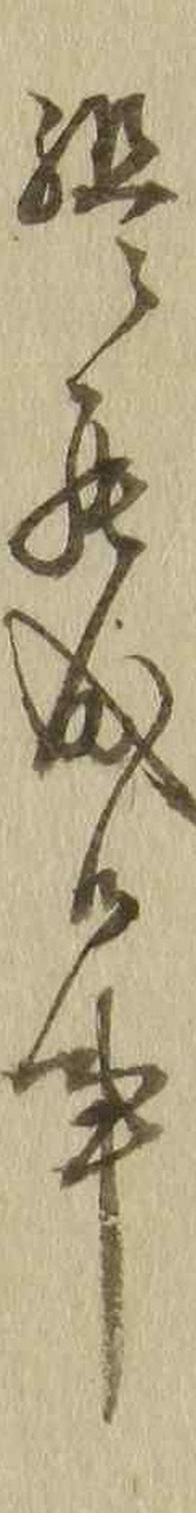組ニ罷成候事
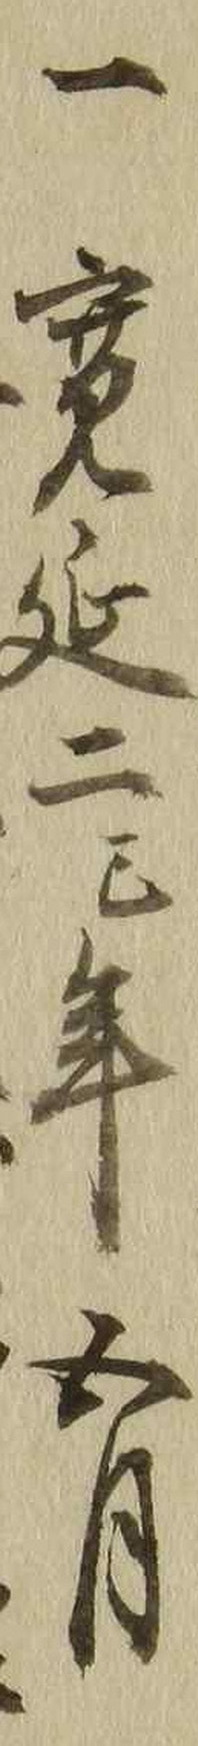一寛永二巳年五月
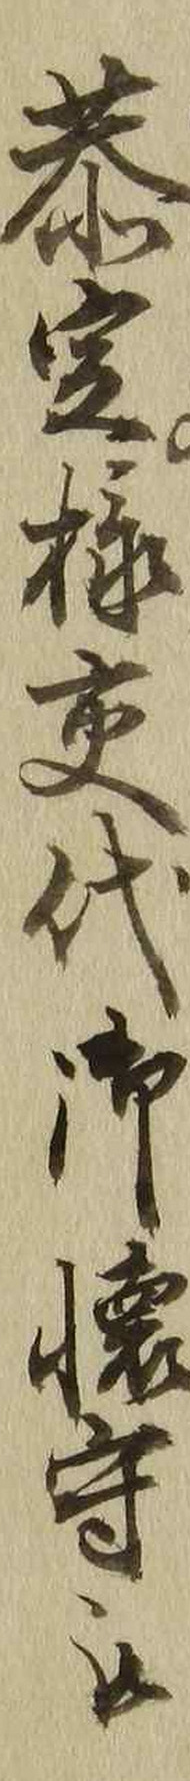恭定様交代御懐守被
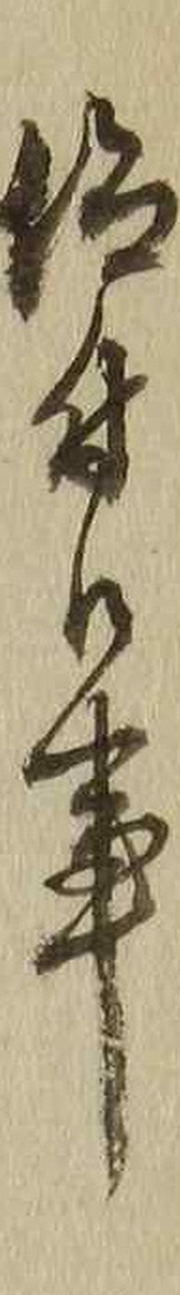仰付候事
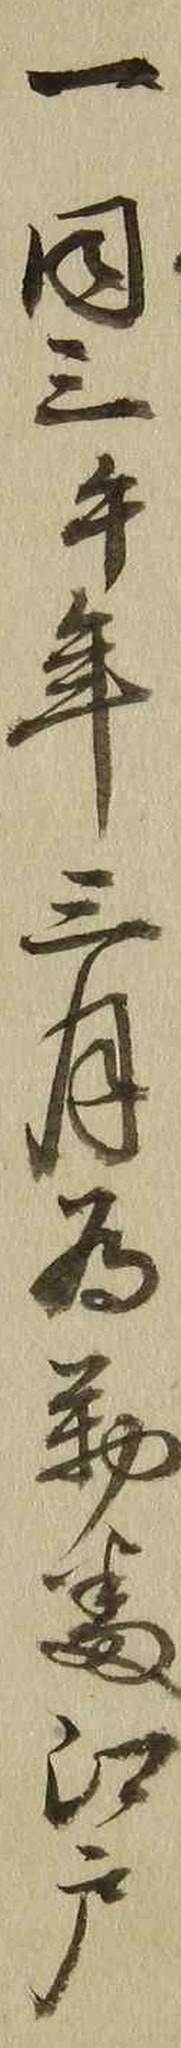一同三午年三月為勤番江戸
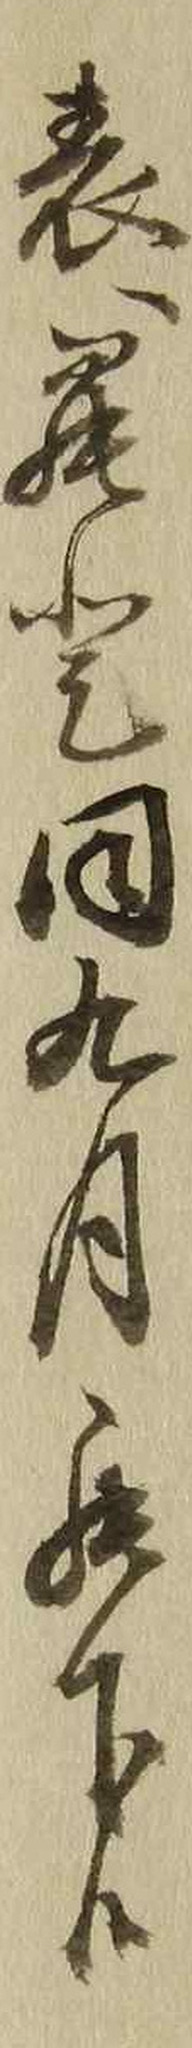表江罷登翌同九月罷下候
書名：諸士系譜　巻之64　と之部7
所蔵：会津若松市立会津図書館
